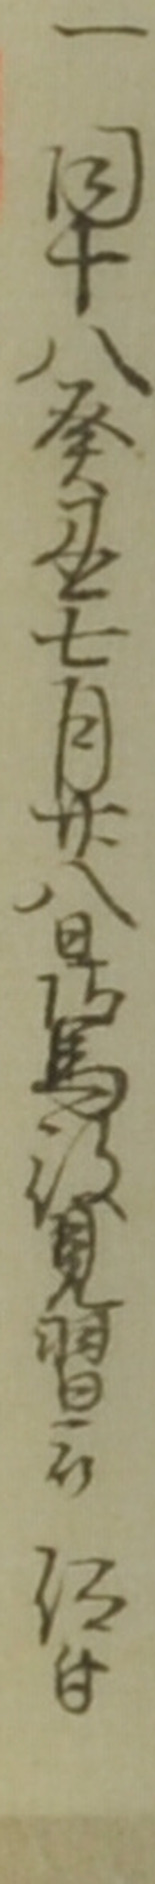一同十八癸丑七月廿八日御馬役見習被仰付

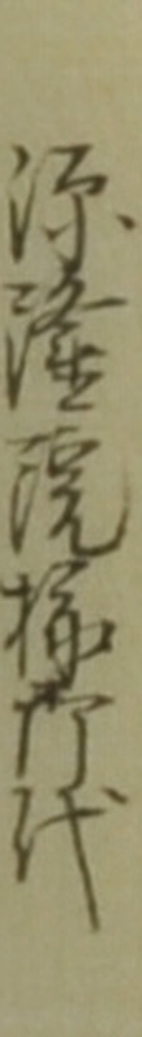源隆院様御代
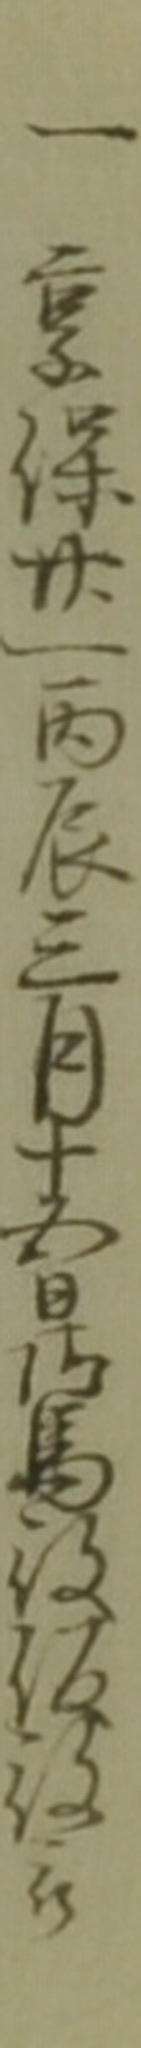一享保廿一丙辰三月十五日御馬役仮役被
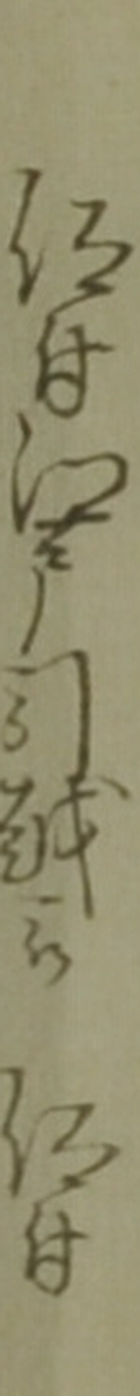仰付江戸引越被仰付
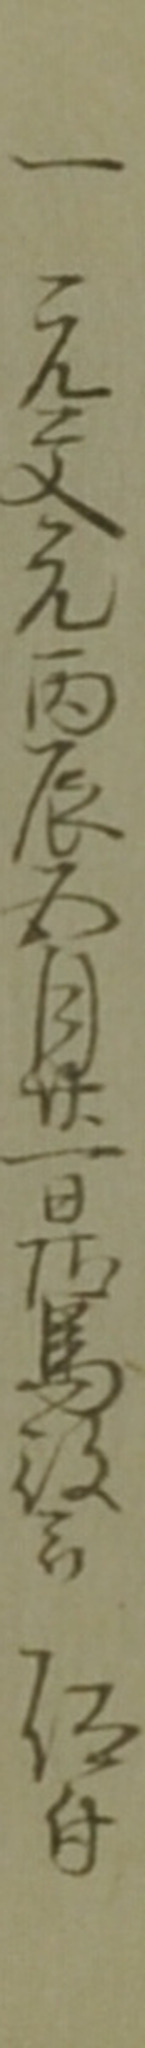一元文元丙辰五月廿一日御馬役被仰付
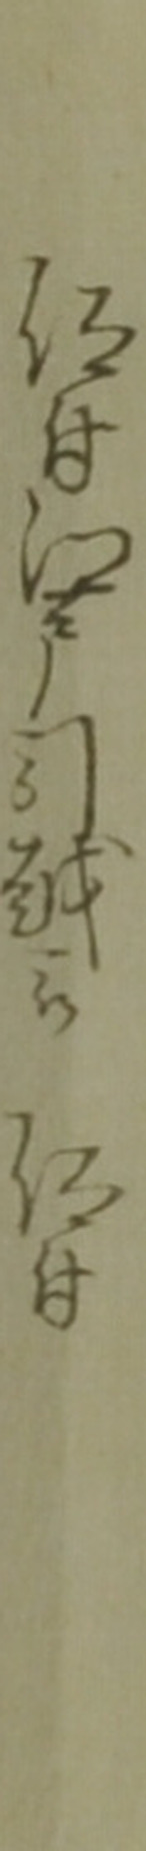仰付江戸引越被仰付
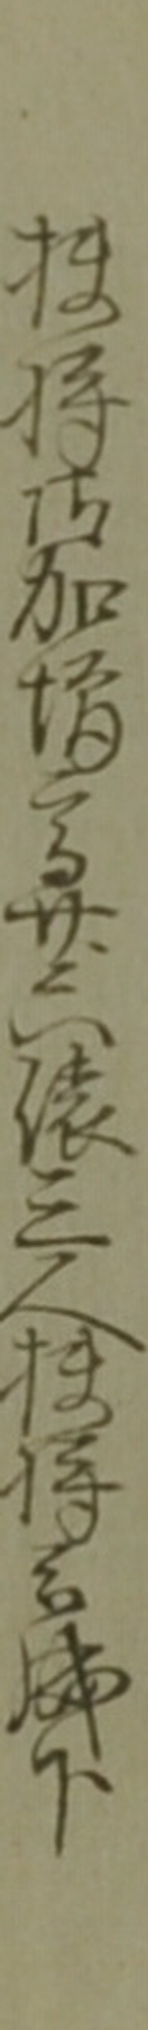仰付二俵御加増高廿俵二人扶持被成下
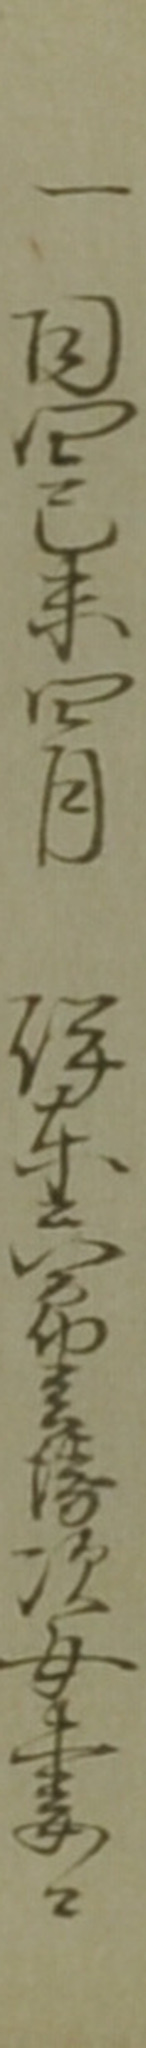一同四己未四月伊東六郎兵衛次女妻ニ
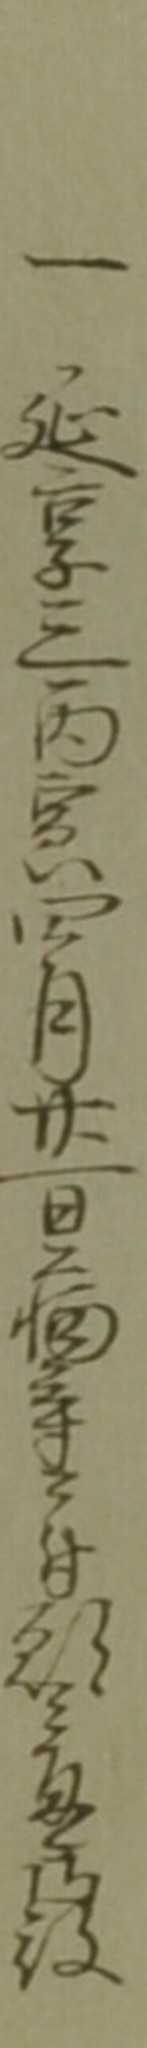一延享三丙寅四月廿一日病気ニ付願之通御役
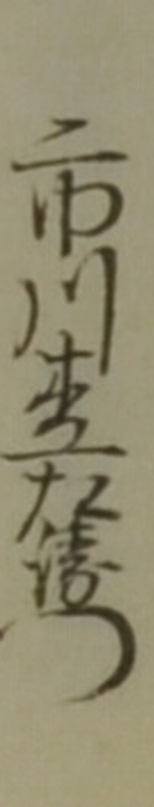市川杢左衛門
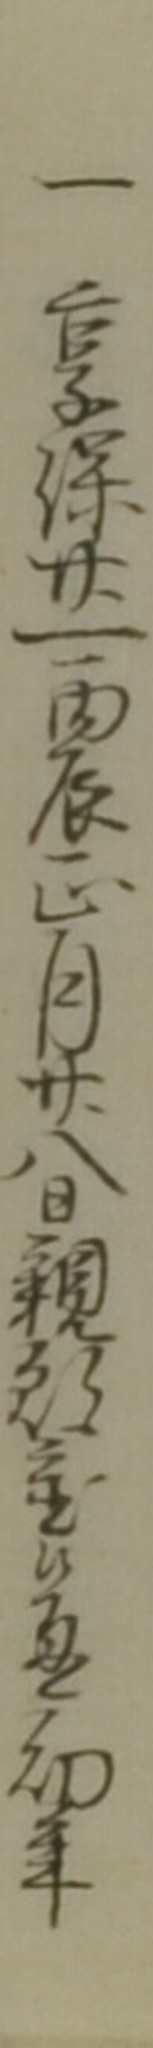一享保廿一丙辰正月廿八日類焼置候通幼年
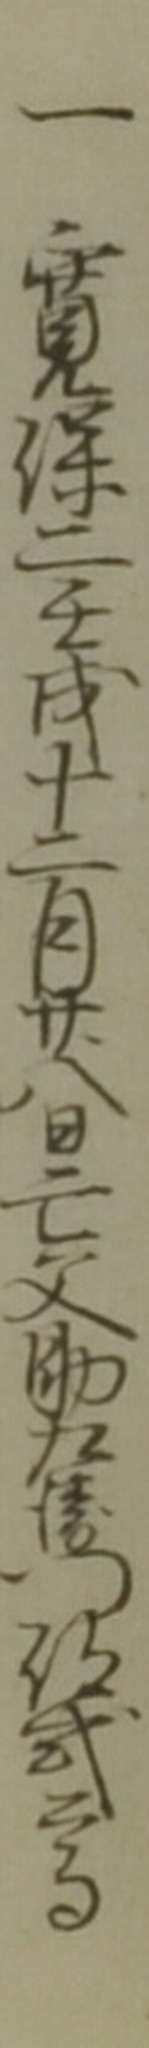一寛保二壬戌十二月廿八日亡父助左衛門跡式高
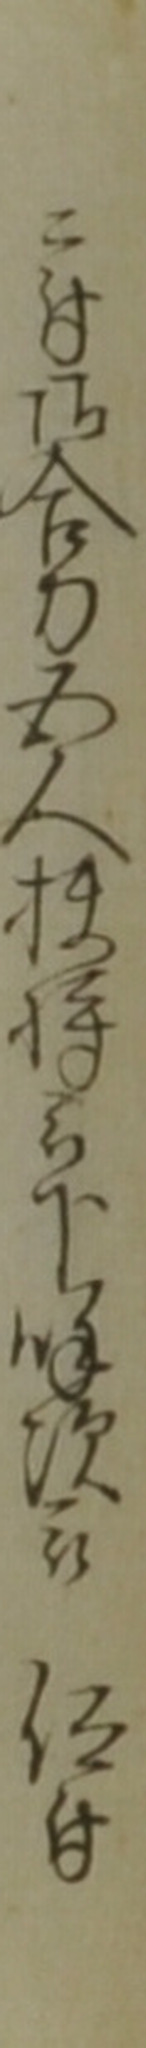ニ付御合力五人扶持被下呼次被仰付
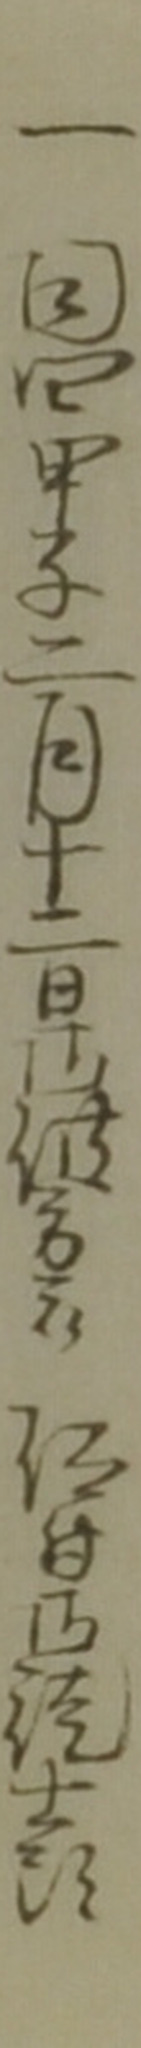一同四甲子二月十二日御供方被仰付御徒士頭
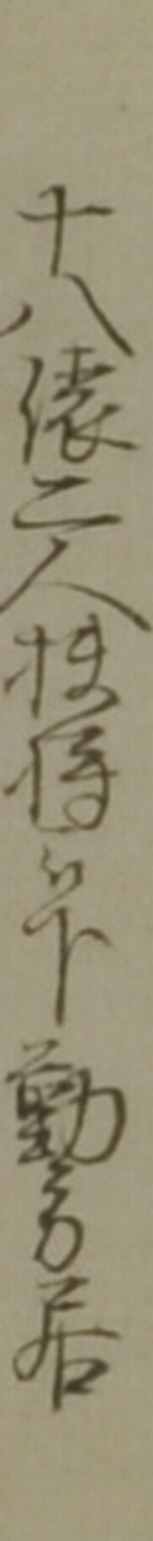十八俵二人扶持被下勤方居
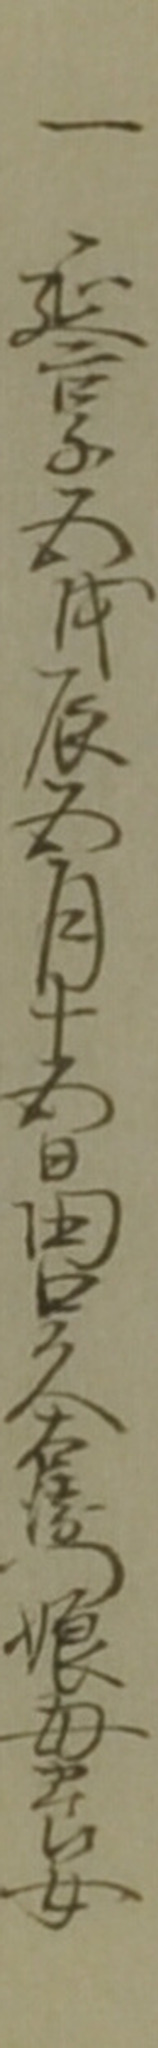一延享五戊辰五月十五日田口久右衛門娘母養女
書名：無足廃家（壱）
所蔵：伊那市立高遠町図書館・合同会社AMANE
